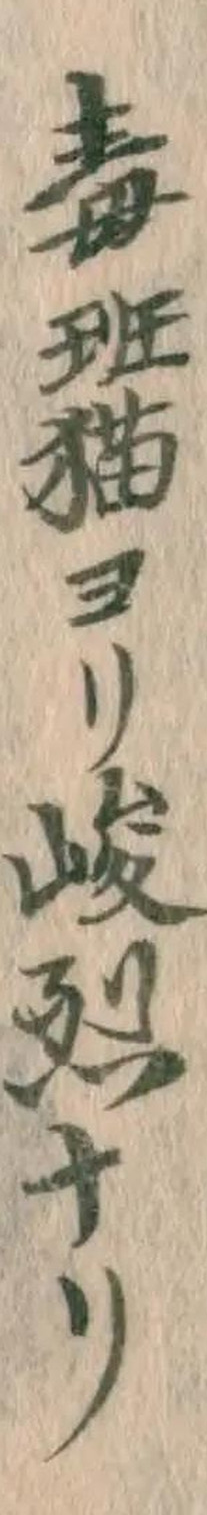毒班猫ヨリ峻烈ナリ

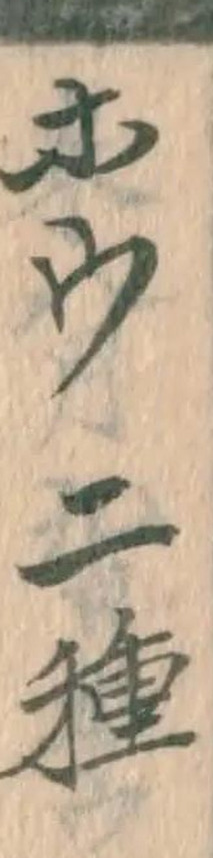ホウ二種
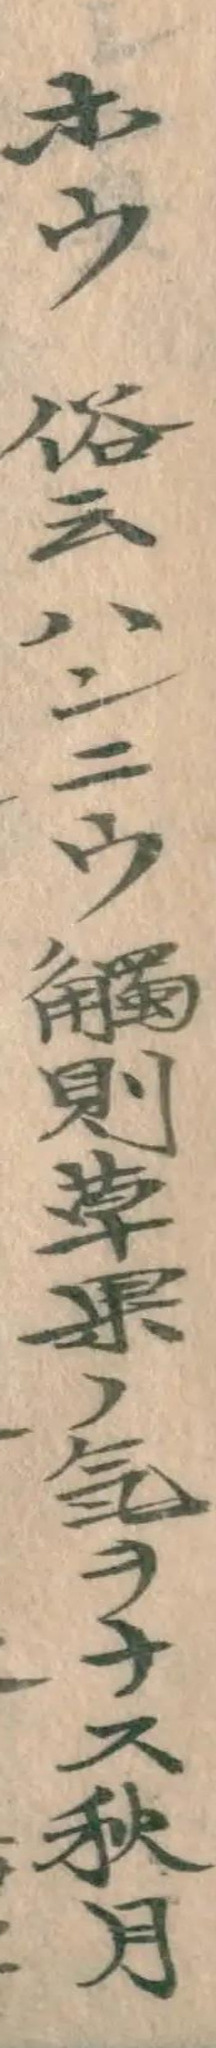ホウ俗云ハンニウ觸則草果ノ気ヲナス秋月
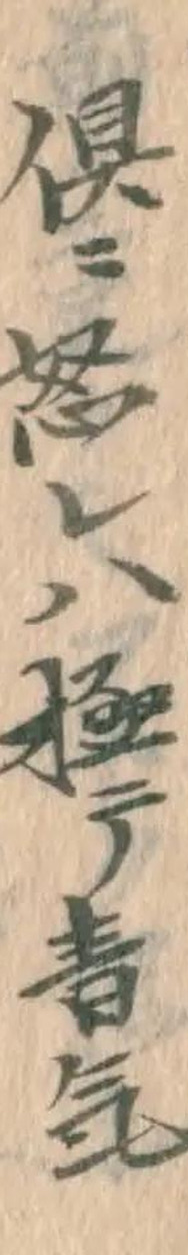倶ニ怒レハ極テ青気
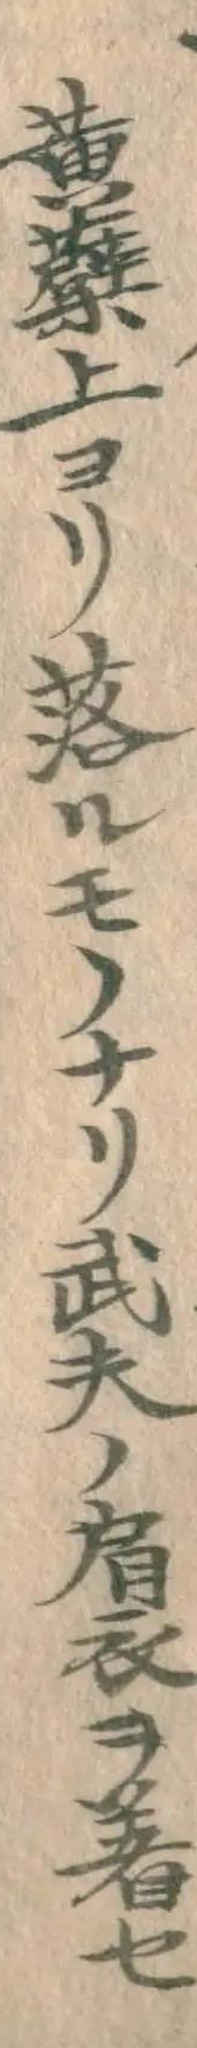黄蘗上ヨリ落ルモノナリ武夫の肩衣ヲ着セ
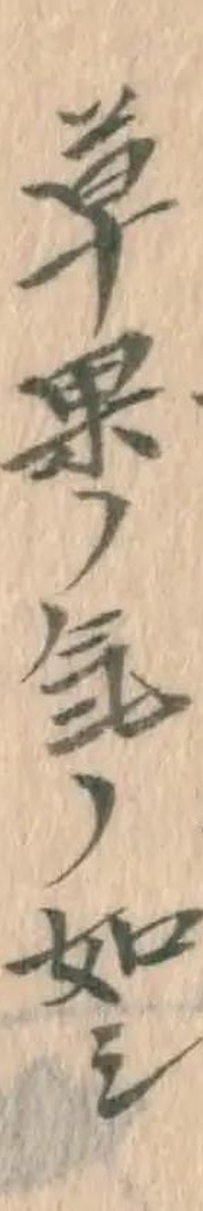草果ノ気ノ如シ
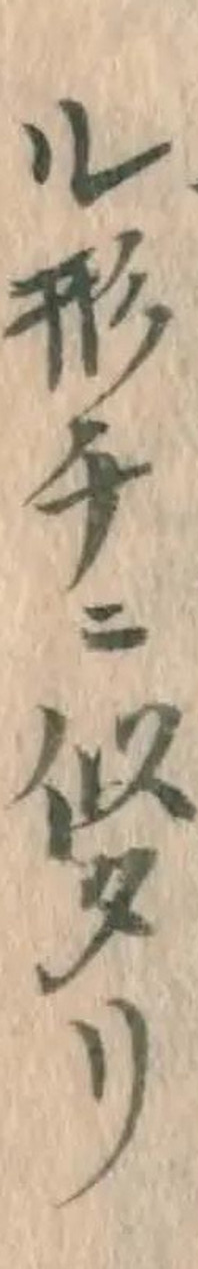ル形チニ似タリ
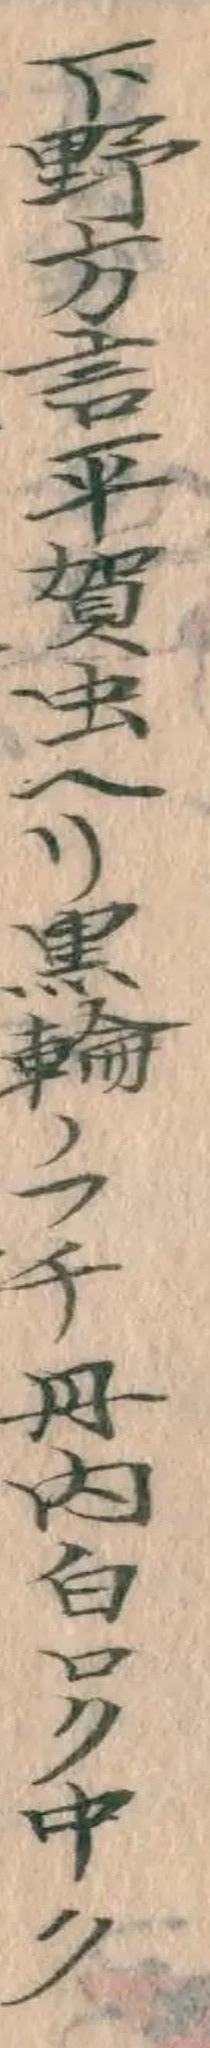下野方言平賀虫ヘリ黒輪ノフチ丹内白ロク中ク
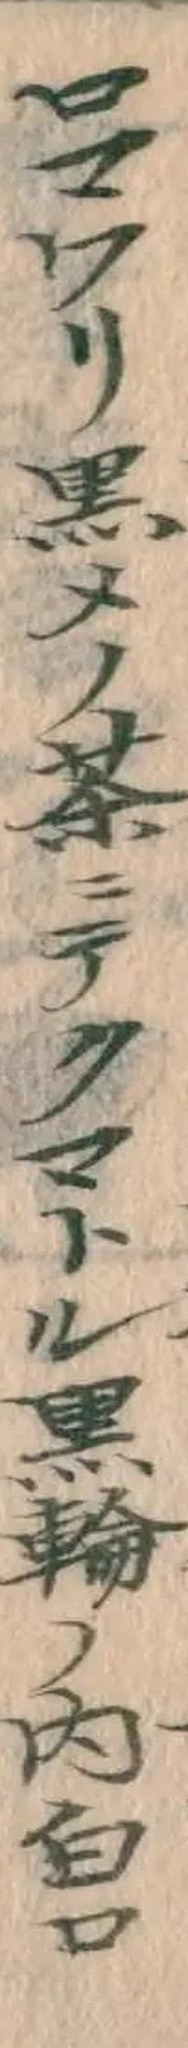ロマワリ黒メノ茶ニテクマトル黒輪ノ内白ロ
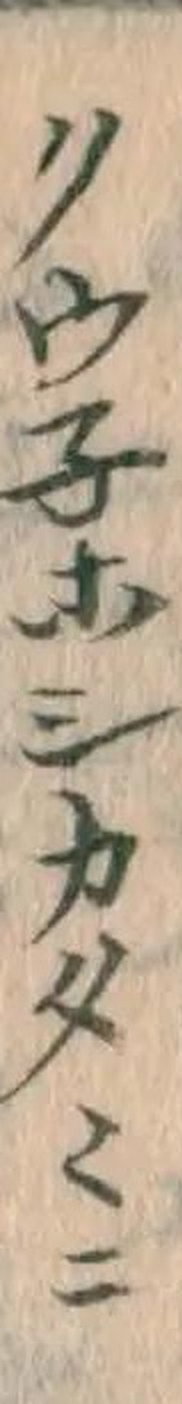クウネホシカタ々ニ
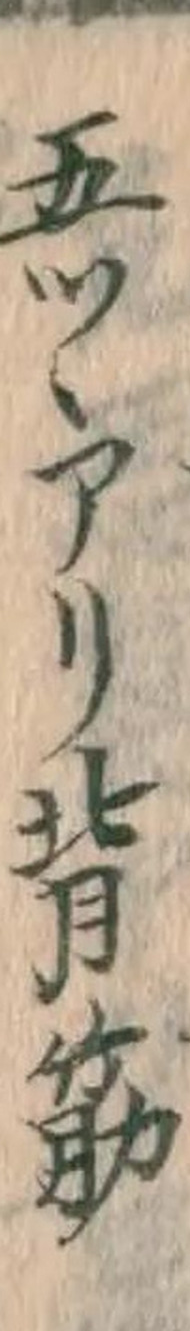五ツヽアリ背筋
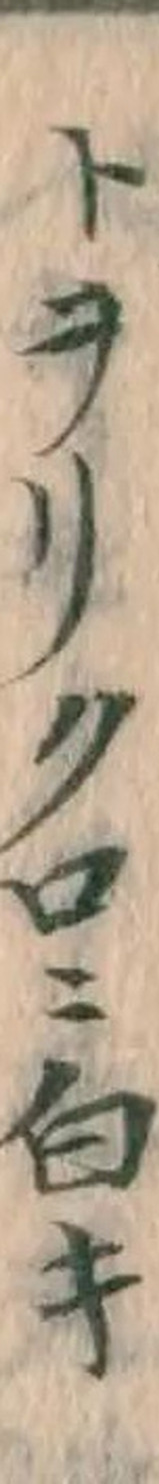トヲリクロニ白キ
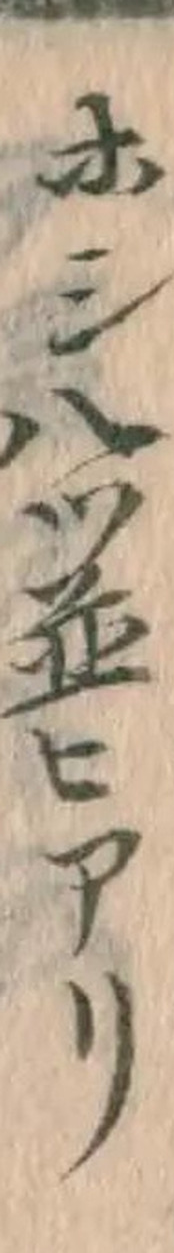ホシ八ツ並ヒアリ
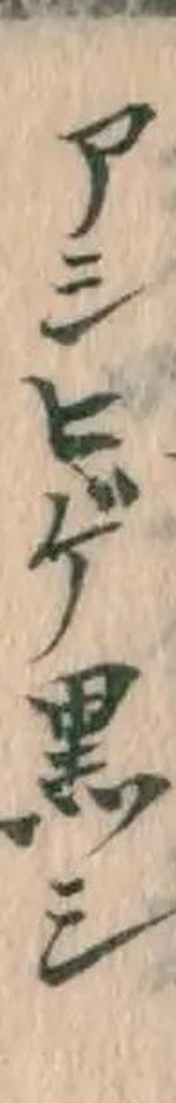アシヒゲ黒シ
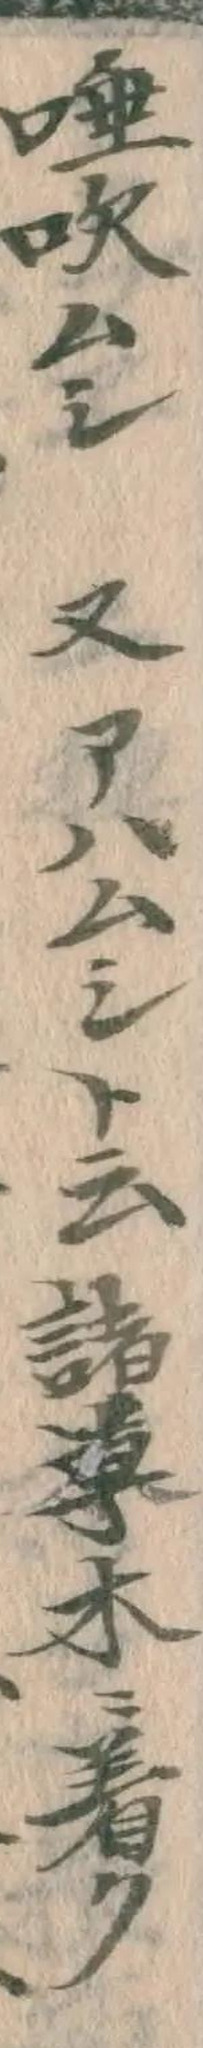唾吹ムシ又アハムシト云諸草木ニ着ク
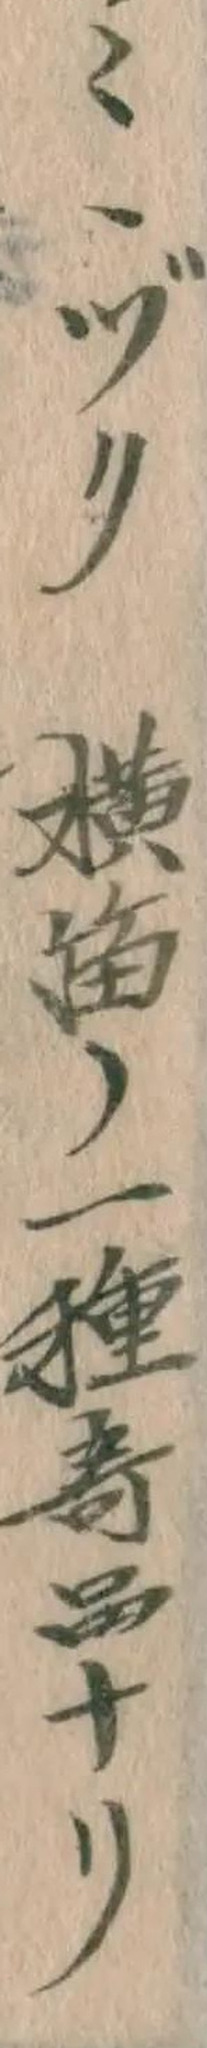ミヽヅク横笛ノ一種奇品ナリ
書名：千蟲譜 3巻. [3]
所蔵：国立国会図書館 National Diet Library, JAPAN
